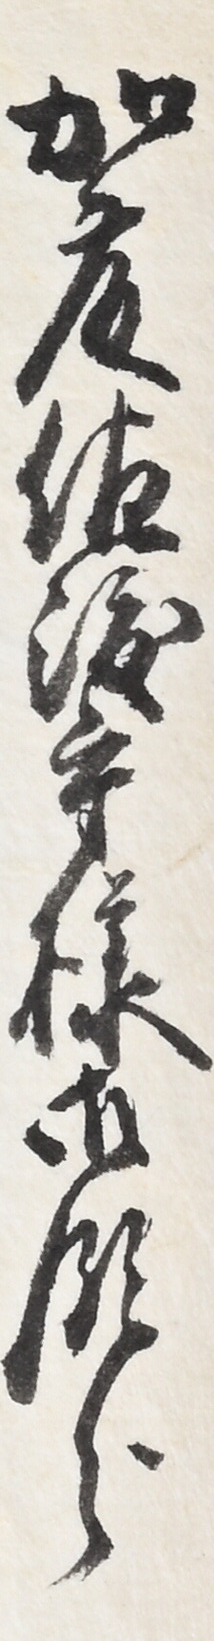加藤佐渡守様御領分
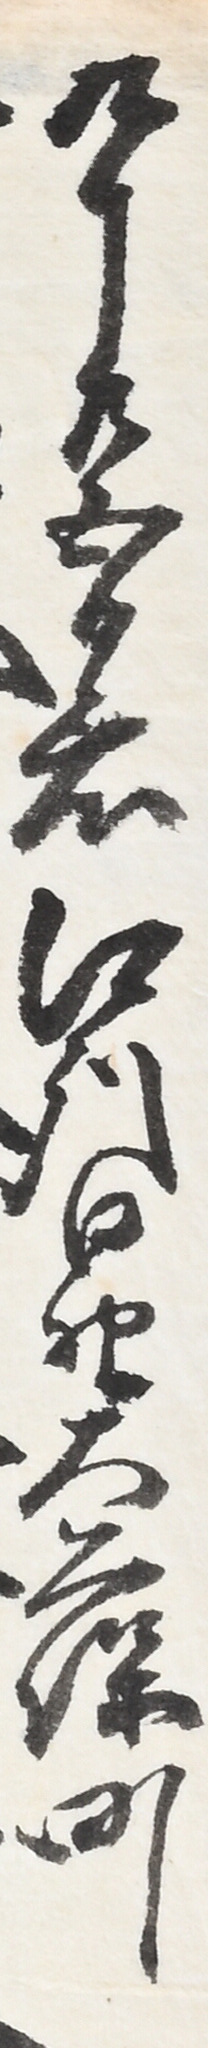九月廿五日着江州日野大久保町
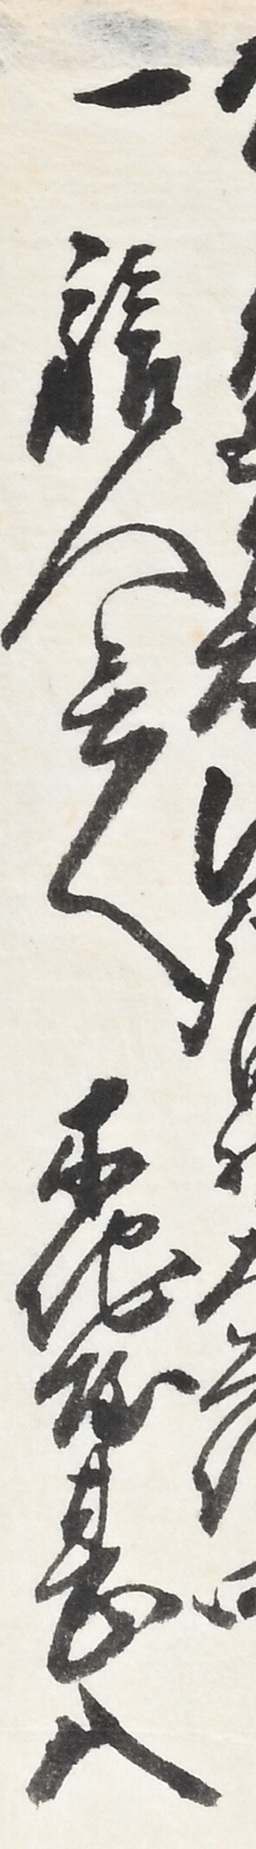一旅人壱人木地屋甚八
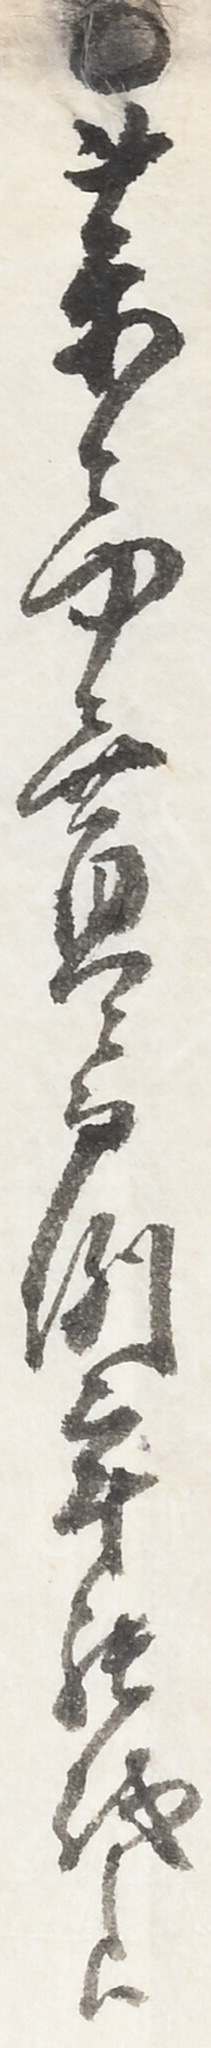〇薬商売ニ而例年罷越申候
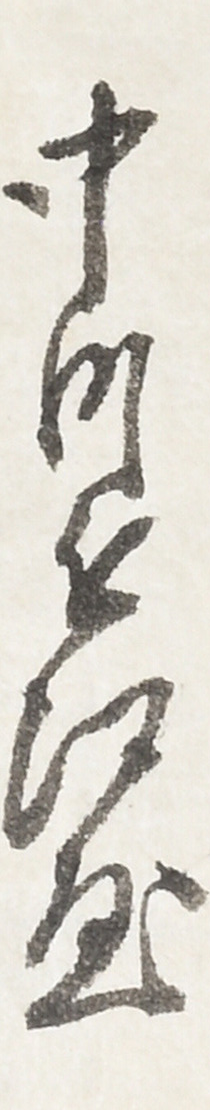中町近江屋
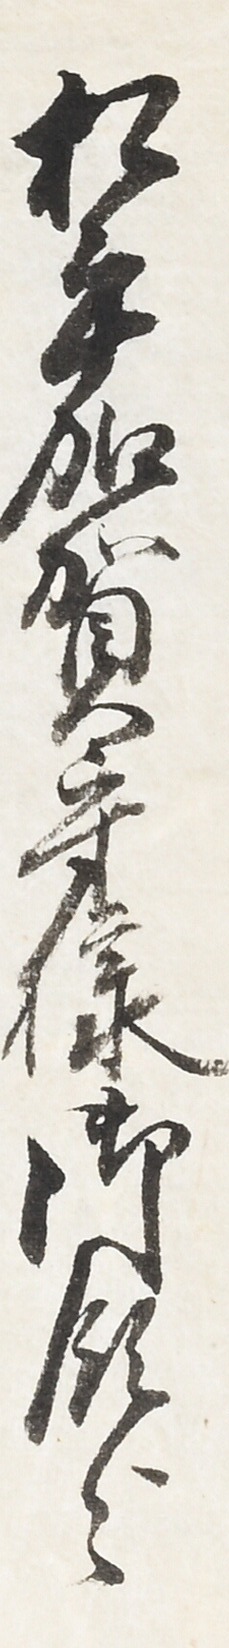松平加賀守様御領分
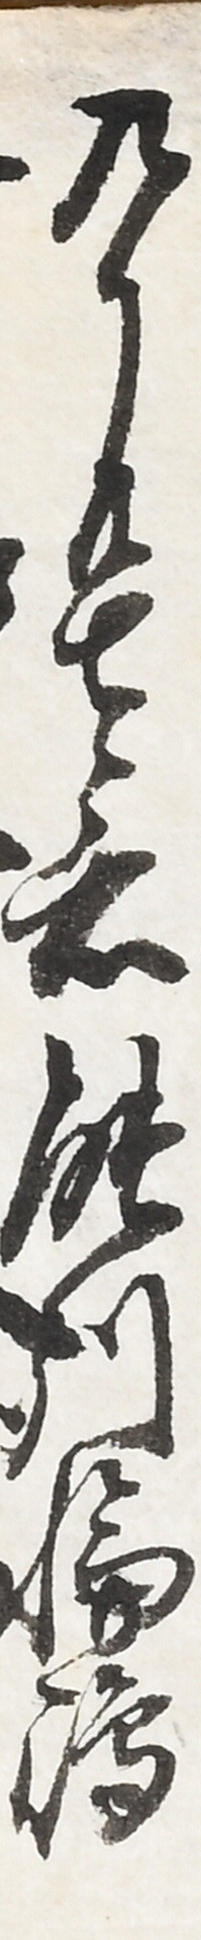九月廿七日着能州輪嶋
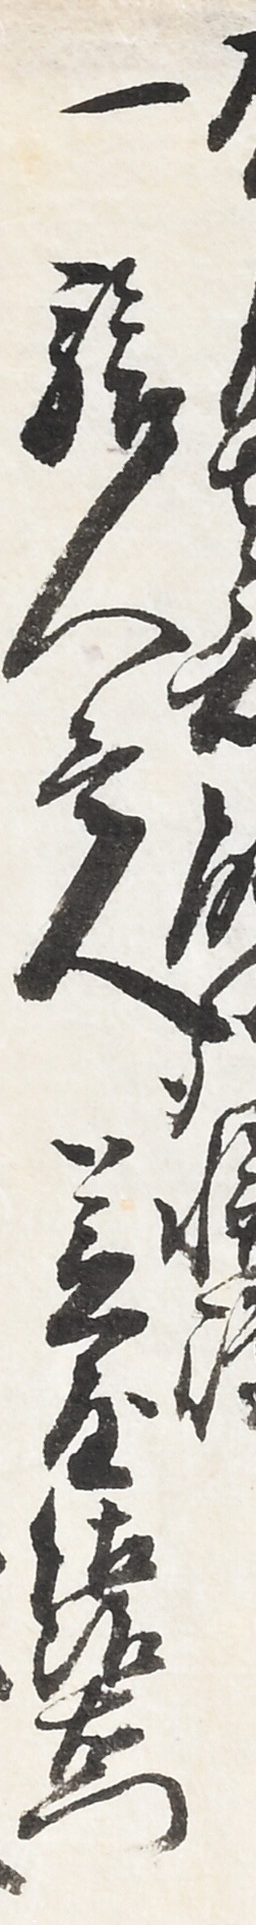一旅人壱人笠屋佐治右衛門
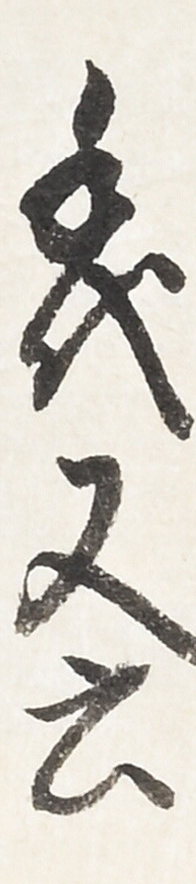手代又六
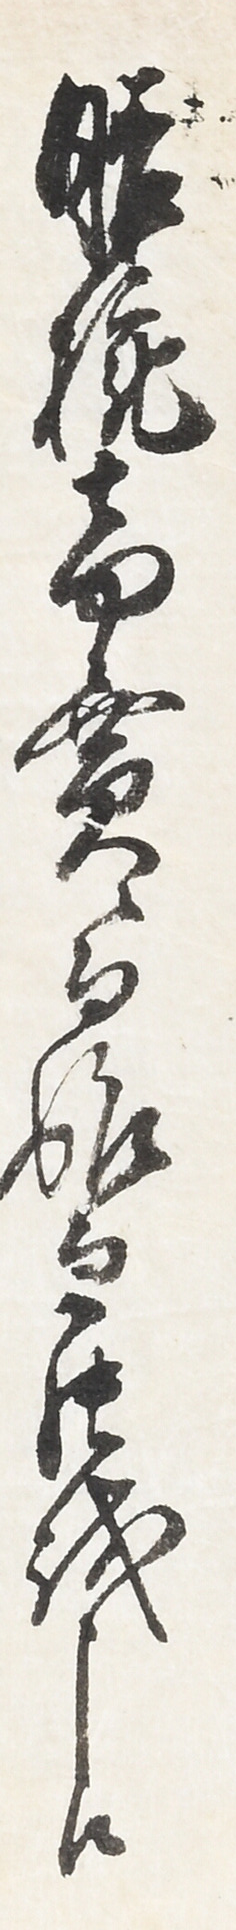膳椀商売ニ而始而罷越申候
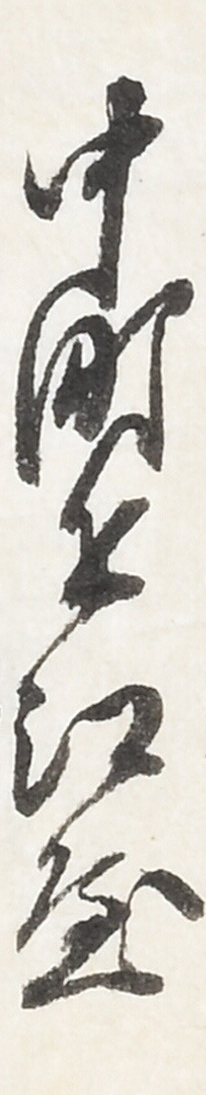中町近江屋
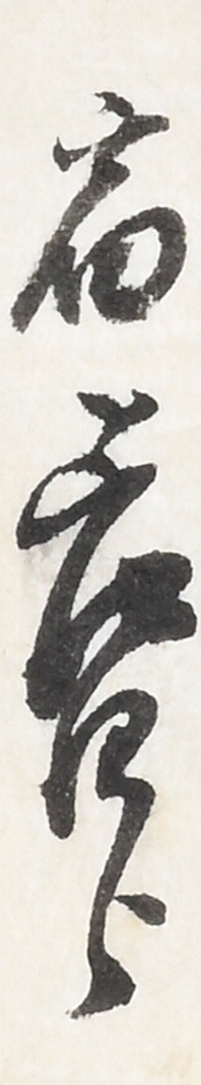宿善四郎
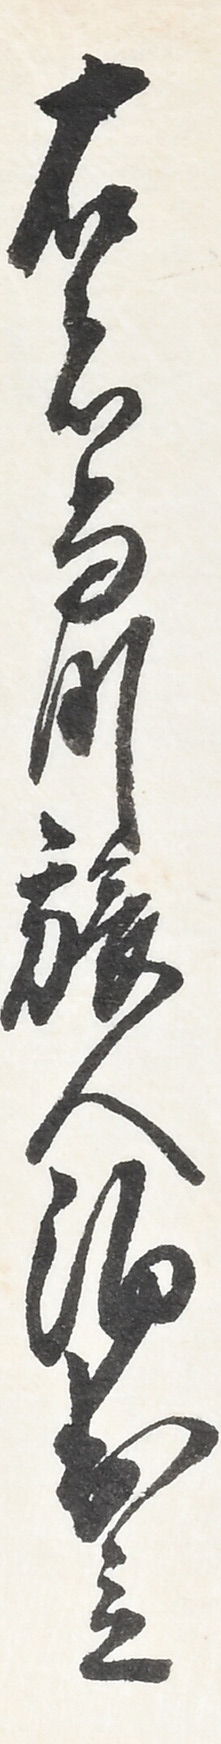右者当町旅人泊出立
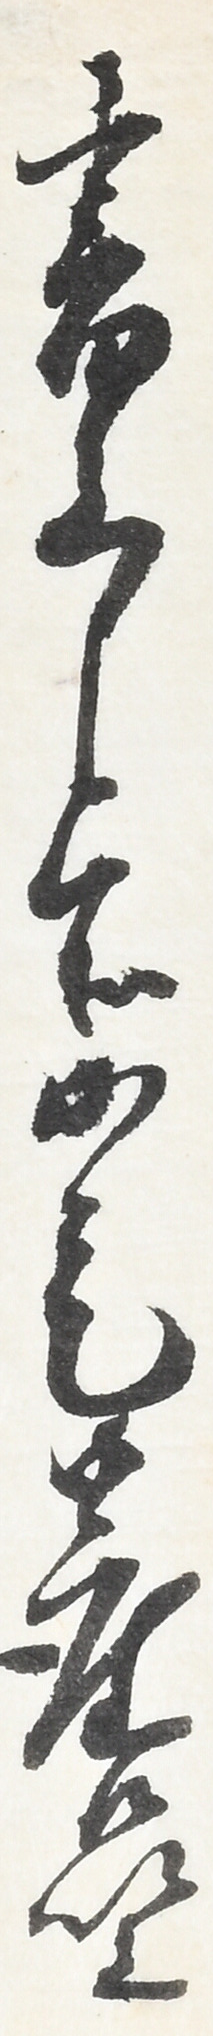書上申候所如是御座候以上
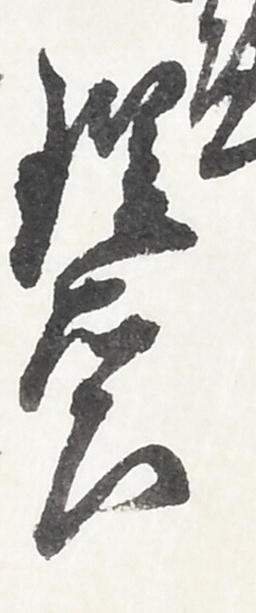理右衛門
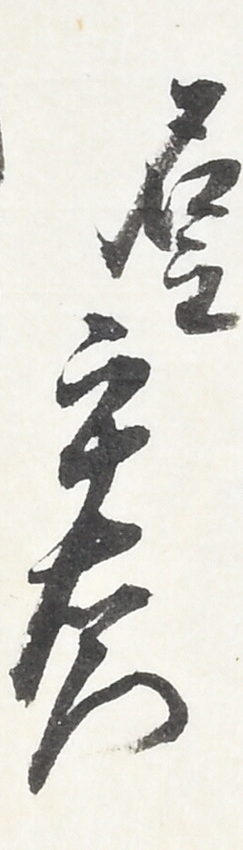理右衛門
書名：旅人泊控帳
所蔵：伊那市立高遠町図書館・合同会社AMANE
